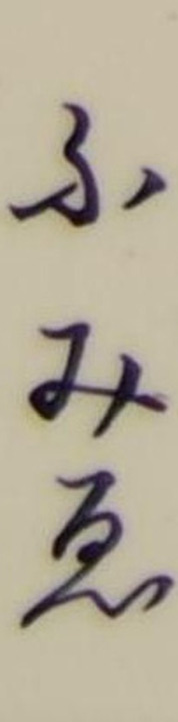ふみゑ
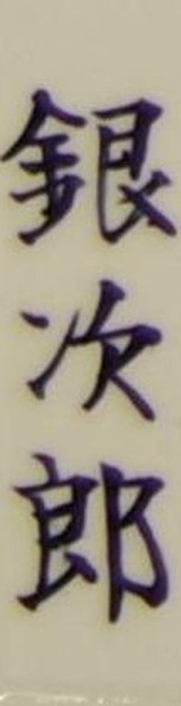銀次郎

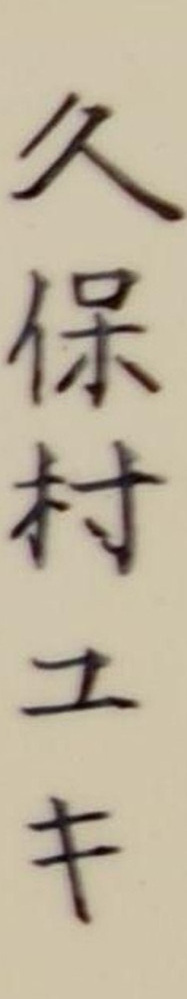久保村ユキ
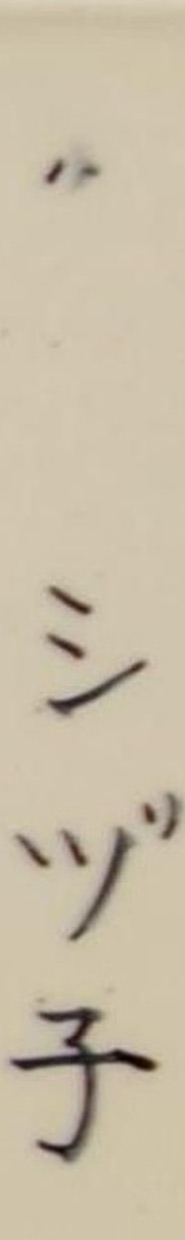シヅ子
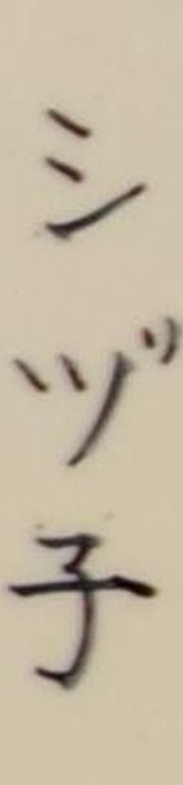シヅ子
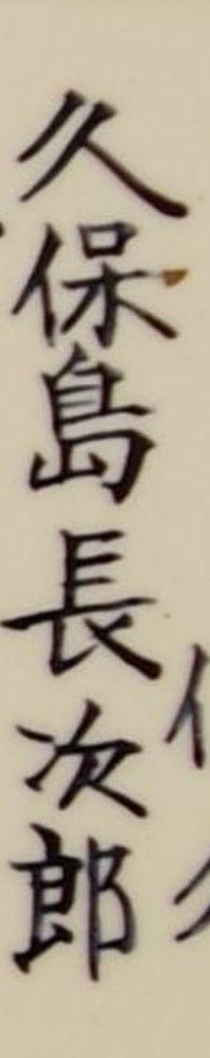久保島長次郎
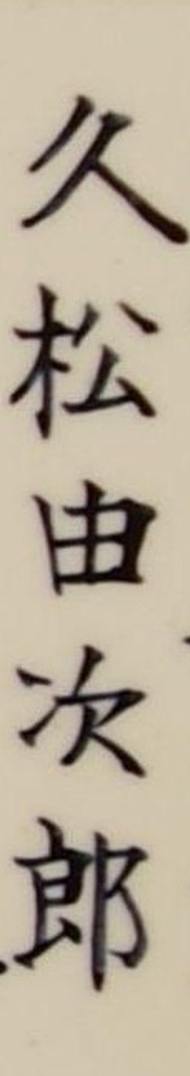久松由次郎
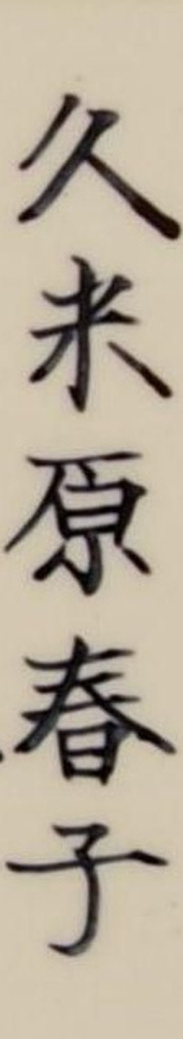久米原春子
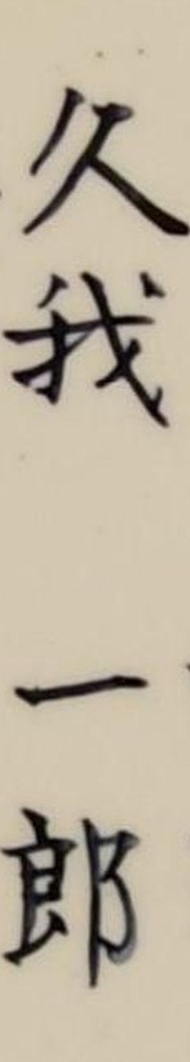久我一郎
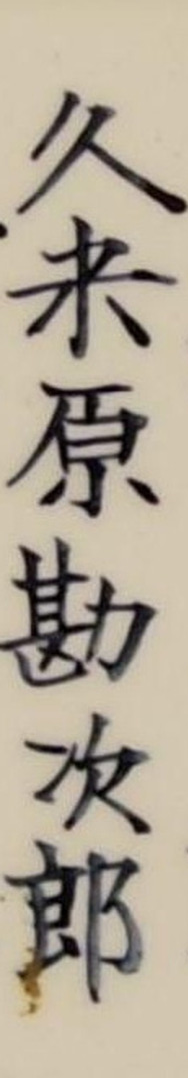久米原勘次郎
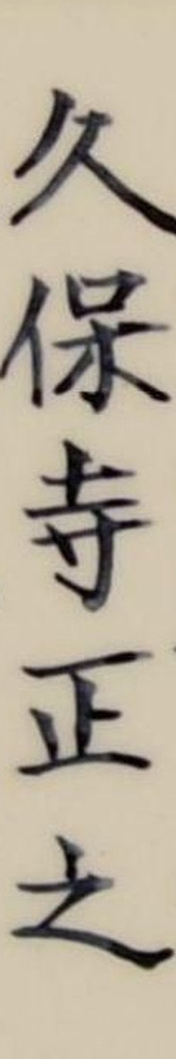久保寺正之
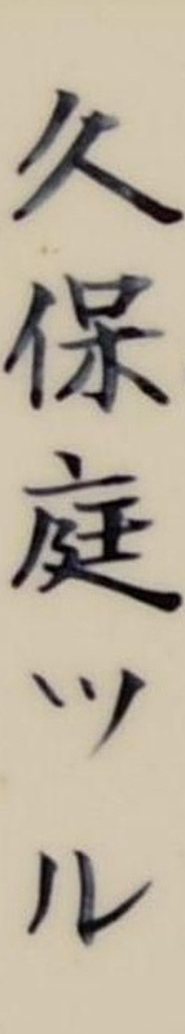久保庭ツル
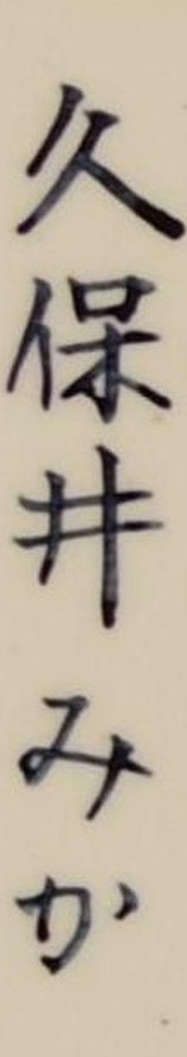久保井みか
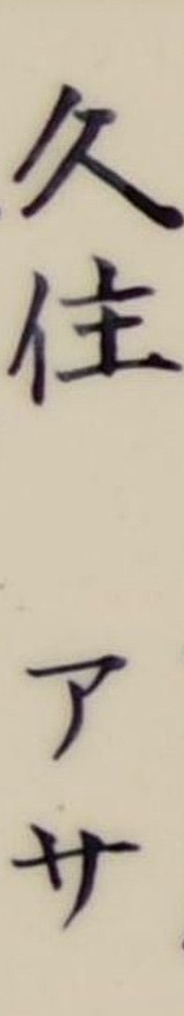久住アサ
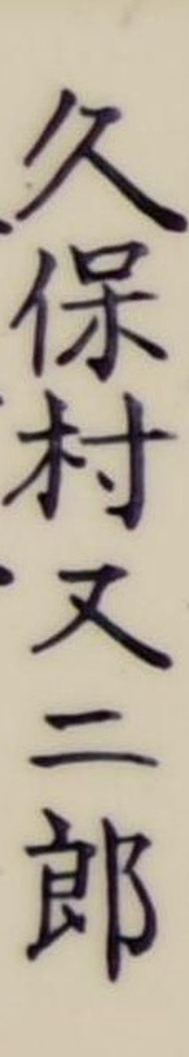久保村又二郎
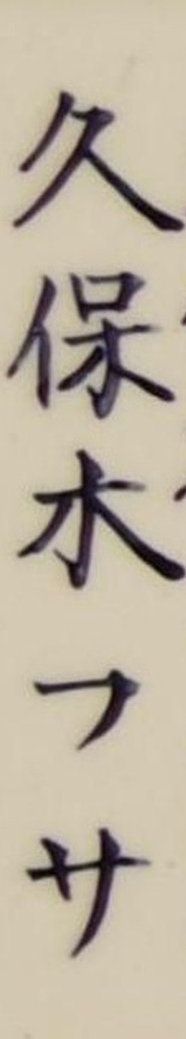久保木フサ
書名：A~D
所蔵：koyasan kongobuji
